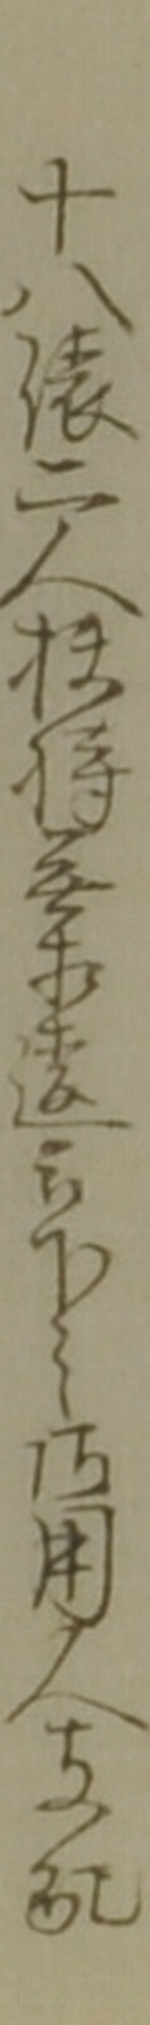十八二人扶持無相違被下之御用人支配

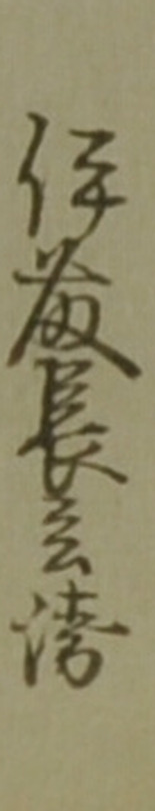伊藤長兵衛
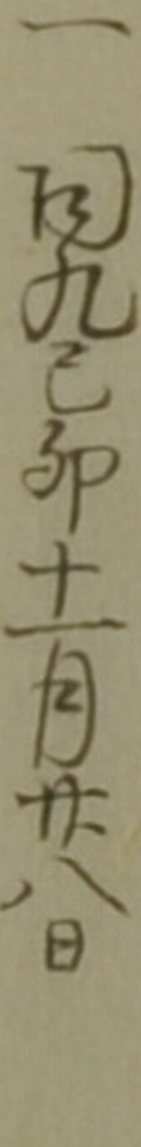一同九己卯十一月廿八日
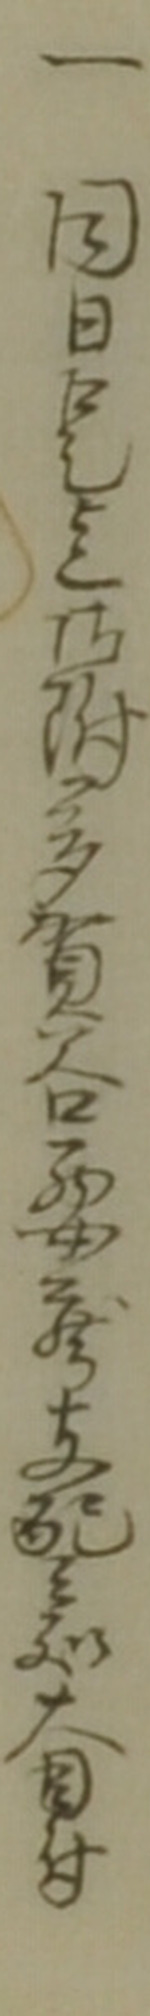一同日是迄御附多賀谷要蔵支配之処大目付
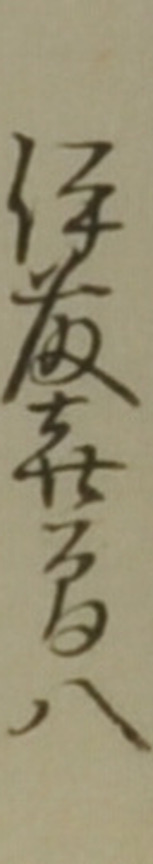伊藤喜曽八

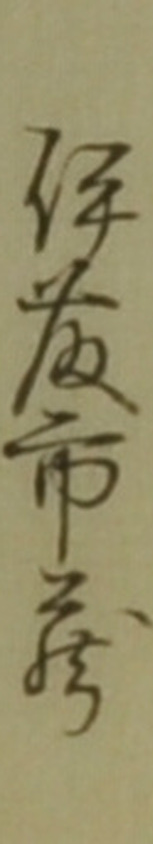伊藤市蔵
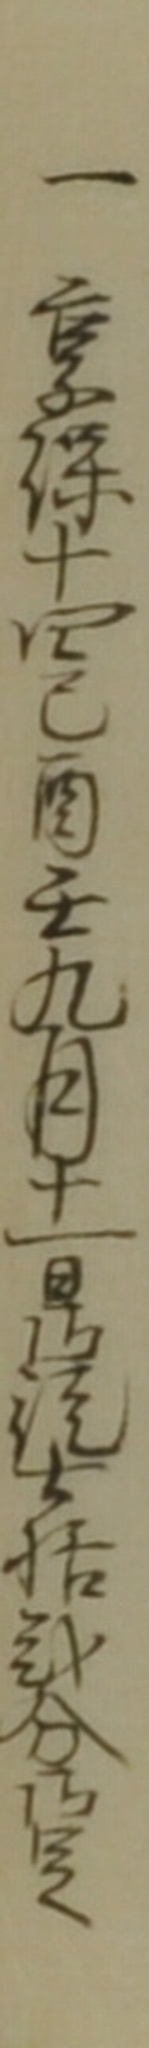一享保十四己酉閏九月十一日御徒士格弐分御定
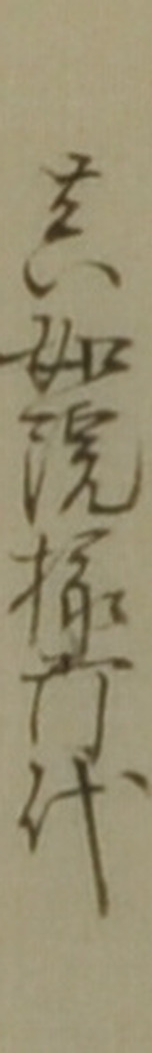真如院様御代
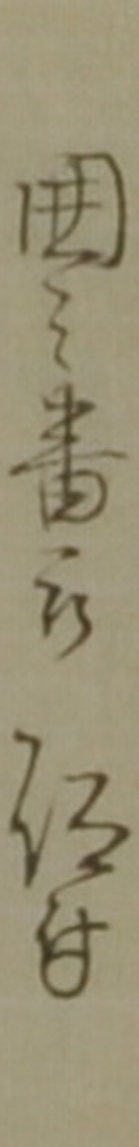囲之番被仰付
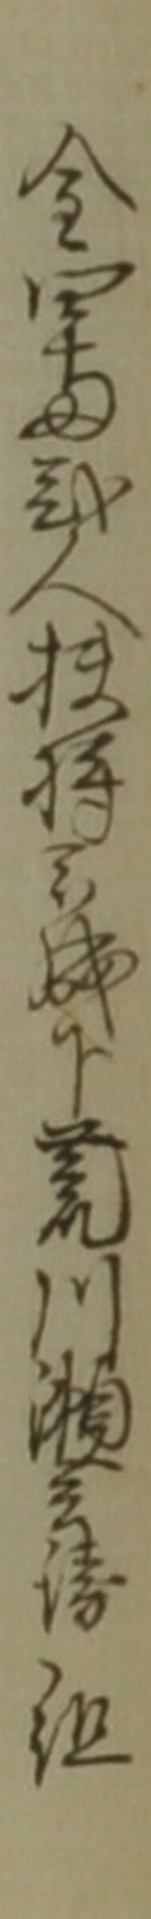金四両弐人扶持被成下荒川瀬兵衛組
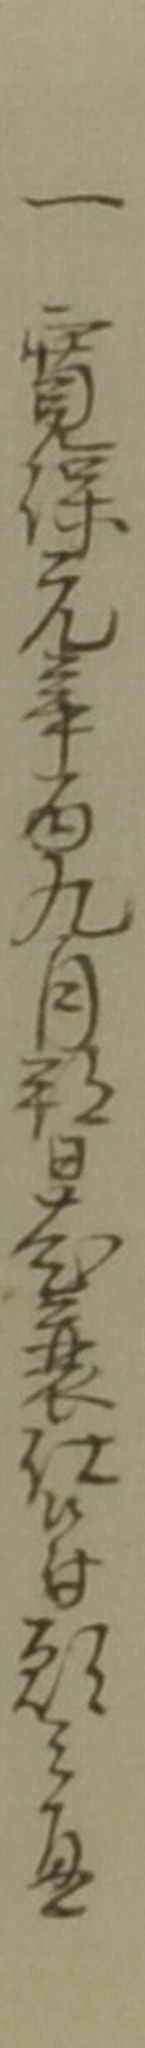一寛保元辛酉九月朔日老衰仕候付願之通
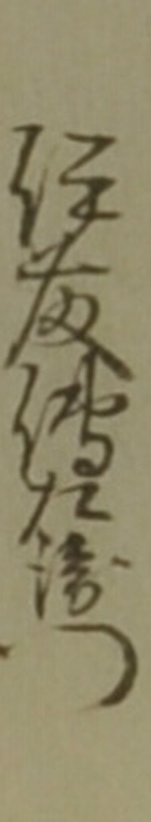伊藤伝左衛門
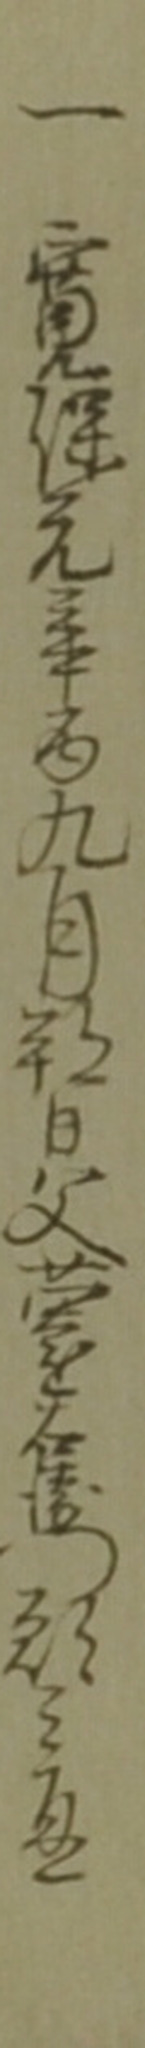一寛保元辛酉九月朔日父薗右衛門願之通
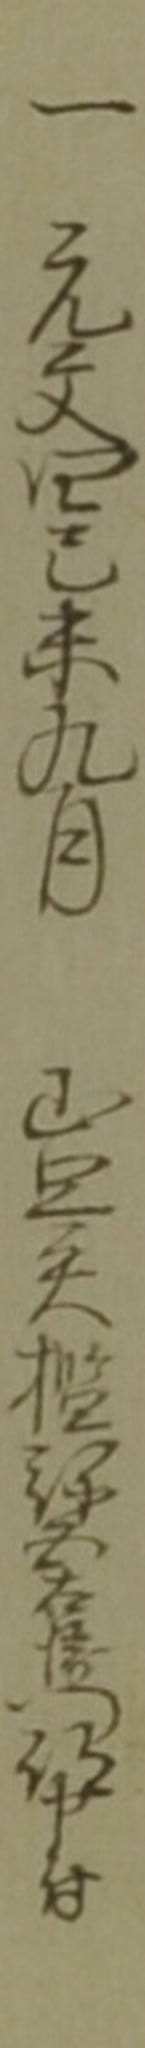一元文四己未九月山廻矢檻弥五右衛門跡申付
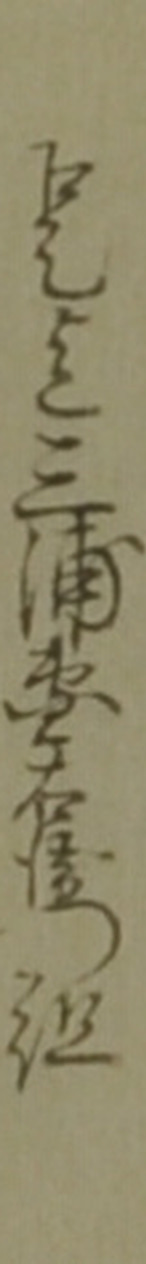是迄三浦團右衛門組
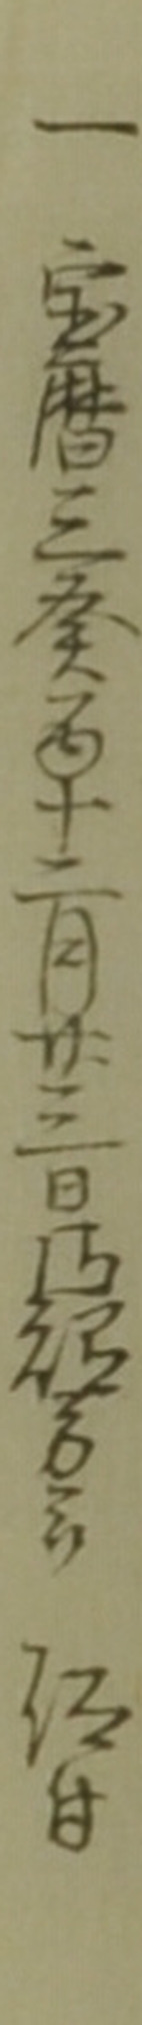一宝暦三癸酉十二月廿三日御賄方被仰付
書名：無足廃家（壱）
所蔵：伊那市立高遠町図書館・合同会社AMANE
